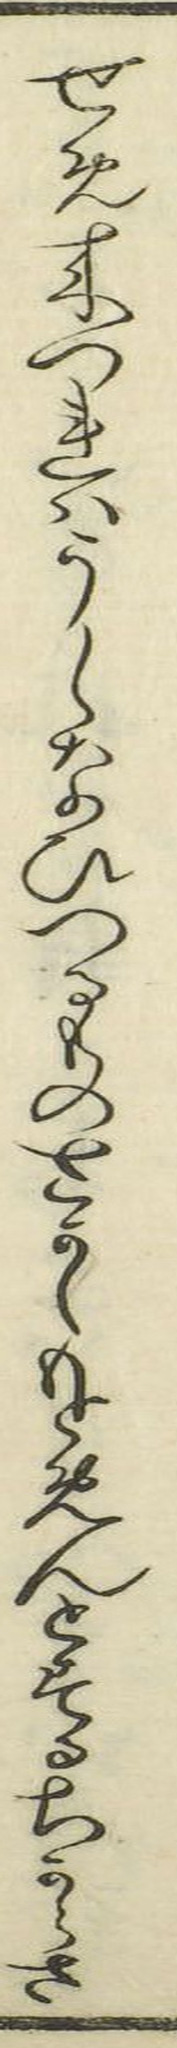せめ来つれハうしなひつるものさかしもとめんとするちからさ
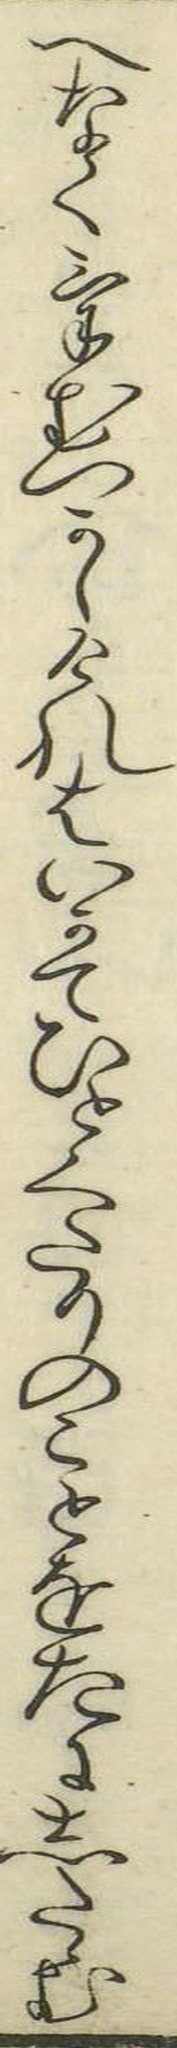へなく気むつかしけれはいかてひとくたりのことをたにしたゝむ
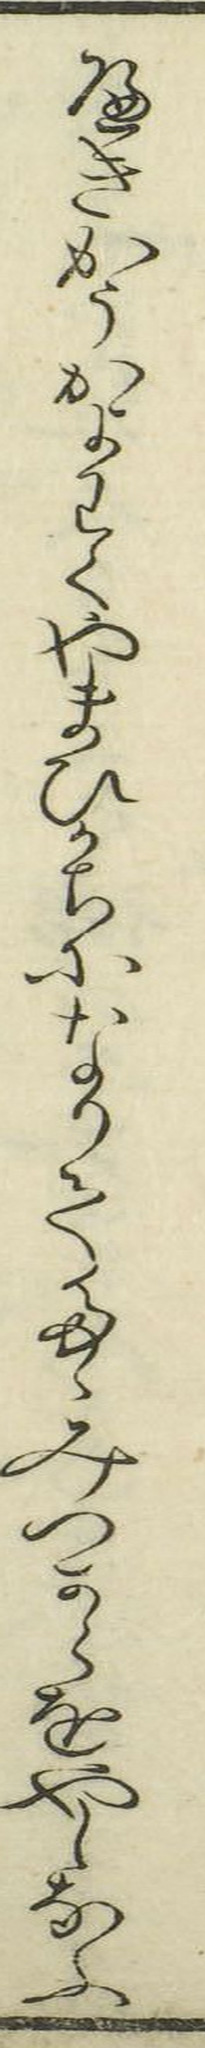へきかうかよわくやまひかちになりてたゝみつからをやしなふ
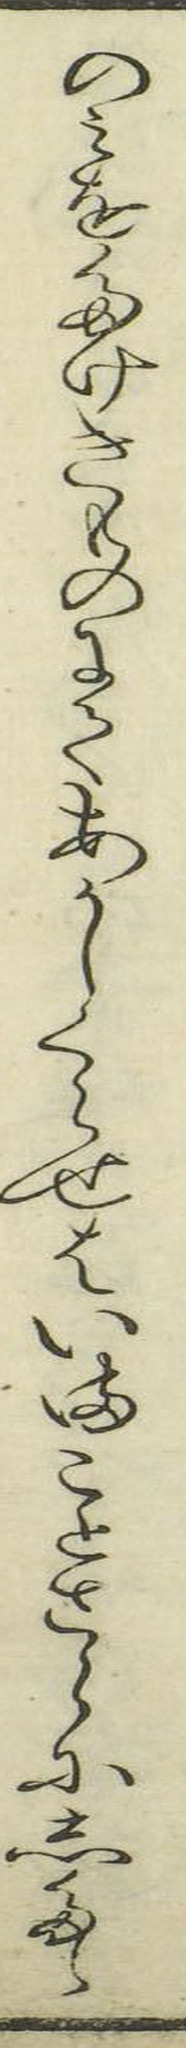のみをたけきものにてあかしくらせはいまことさらにしたゝ
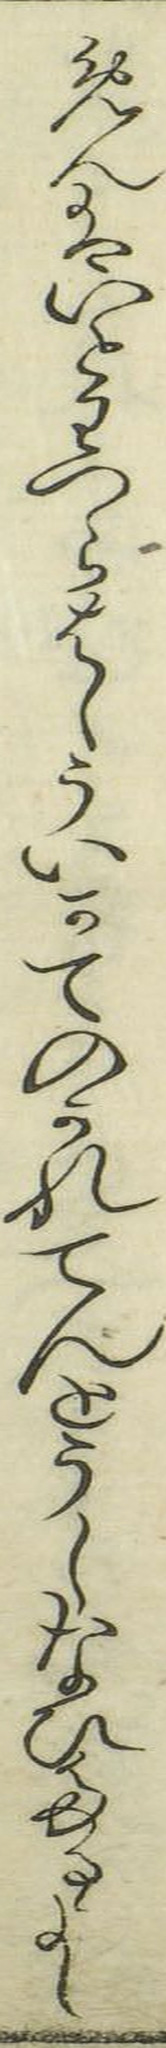めんはいとわつらはしういかてのかれてんとうしなひたるゝ事
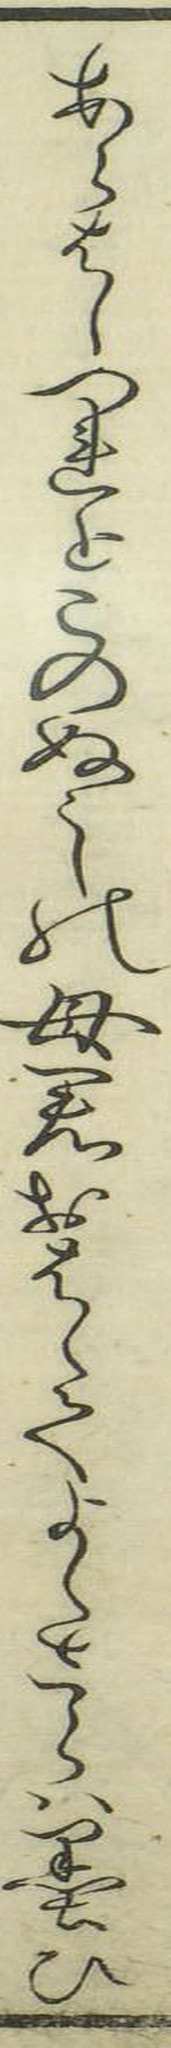あらはしつれとこのぬしの母君おはしてよしさらは墨ひ

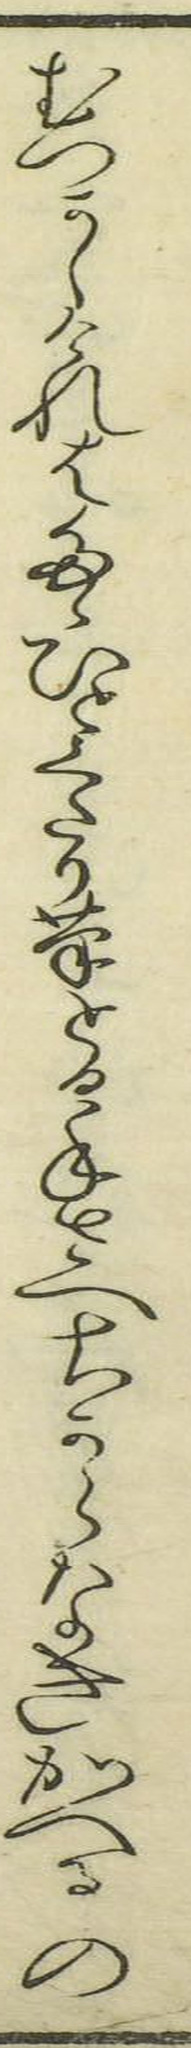むつかしけれはたゝひとくたり茟とる手さへちからなきかへるの
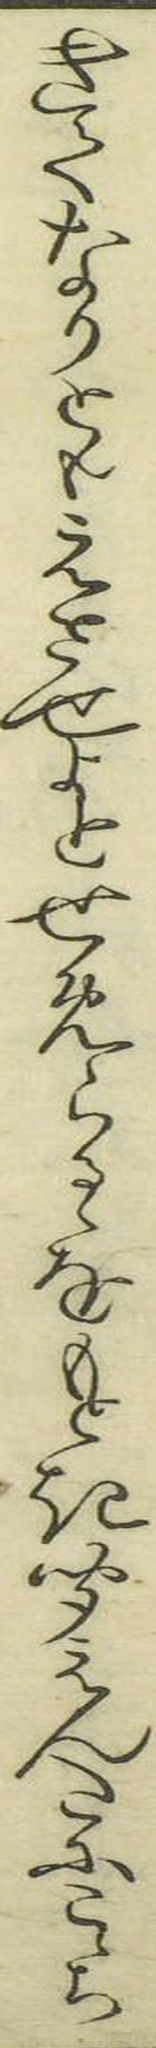きてなりともえさせよとせめらるゝをもとき聞えんたにこゝち
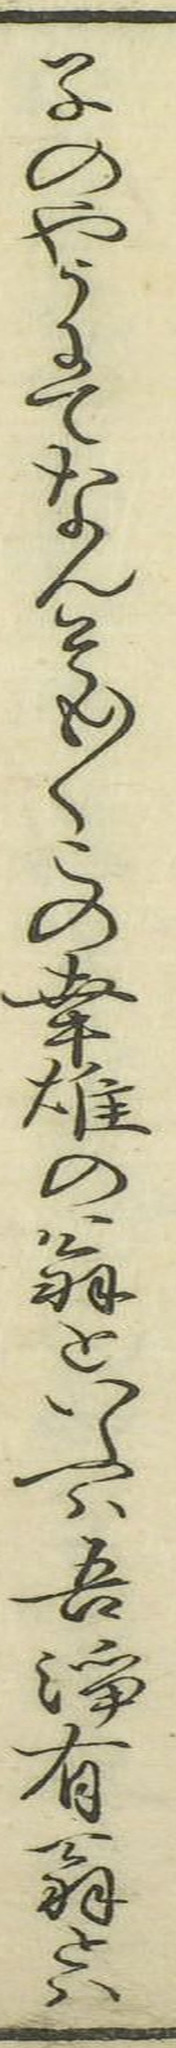子のやうにてなんそも〳〵この幸雄の翁といふは吾浄有翁とは
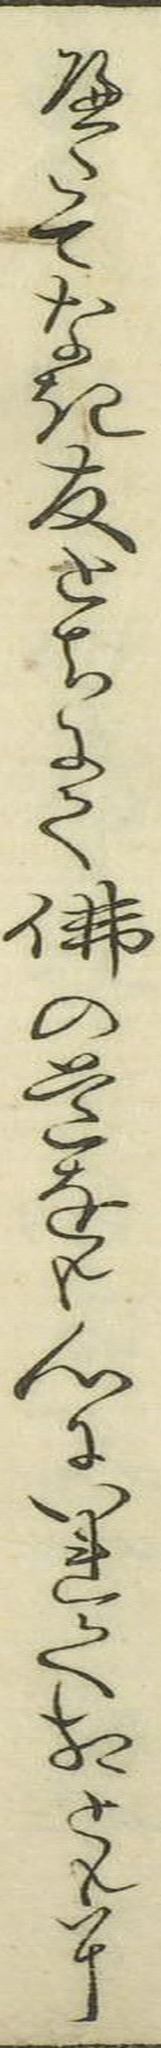へたてなき友とちにて佛の道をも心にいれて相ともに
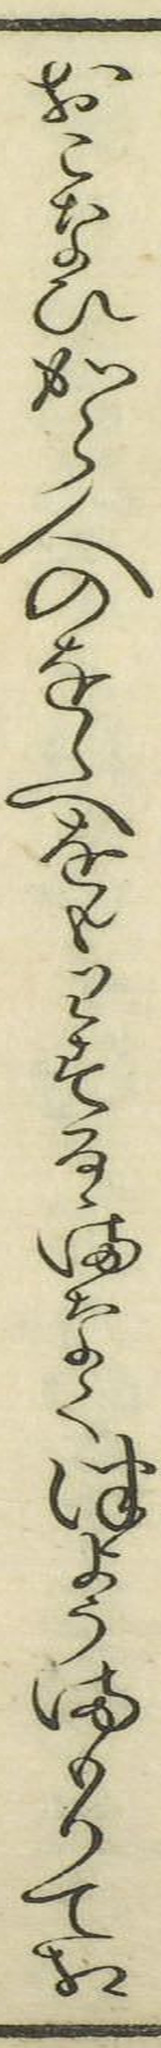おこなひから人のをしへをもわするゝまなくつようまもりて相
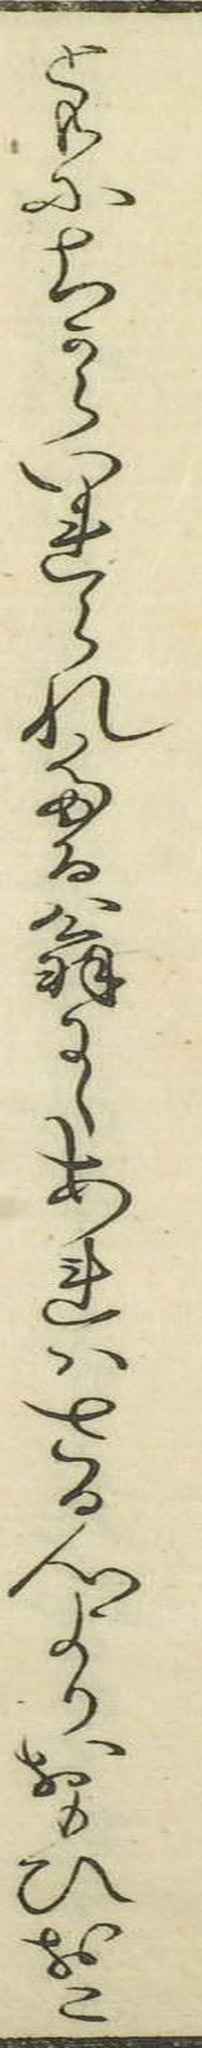ともにちからいれられたる翁にしあれはさる心よりおもひおこ
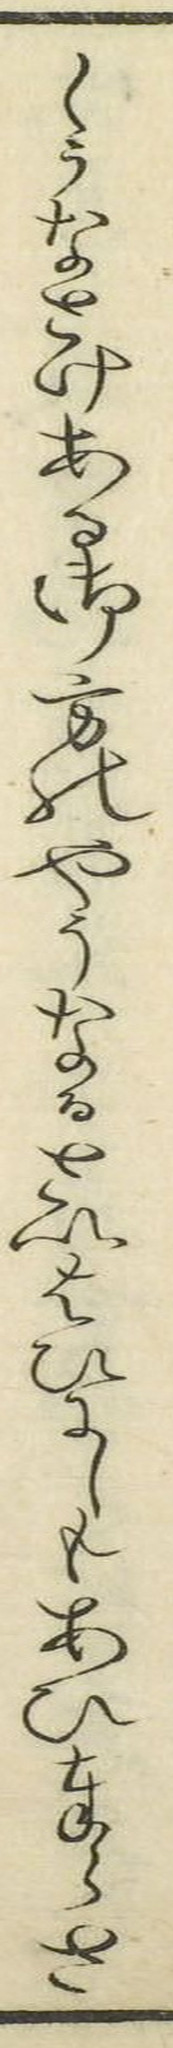しうなさけある御方のやうなるさいはひにしもあひ奉らさ
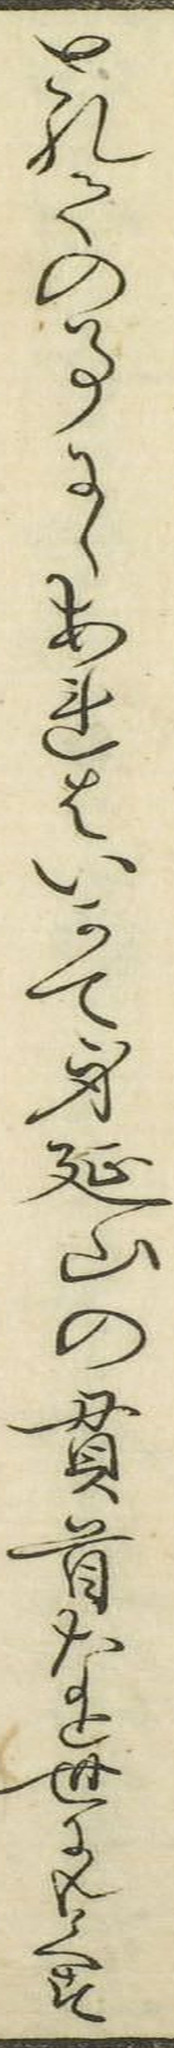されての事にしあれはいかて身延山の貫首なと世にもくす
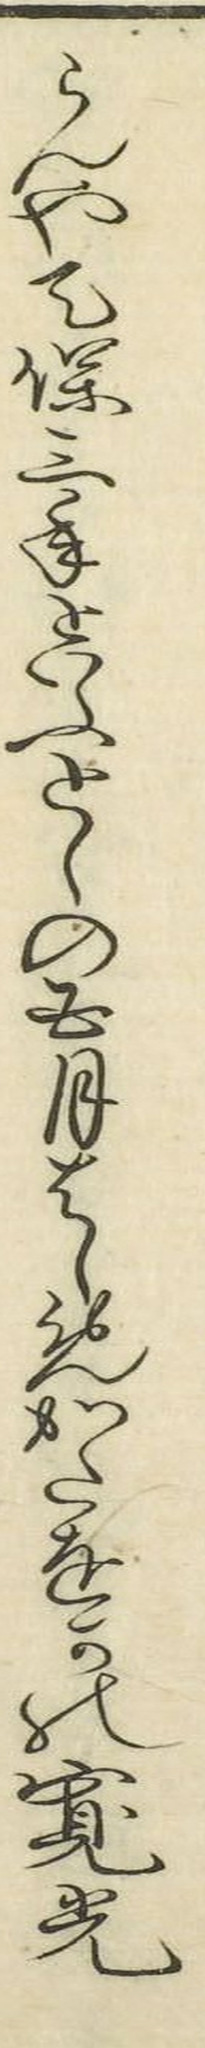らんや天保三年といふとしの五月はしめかたをかの寛光
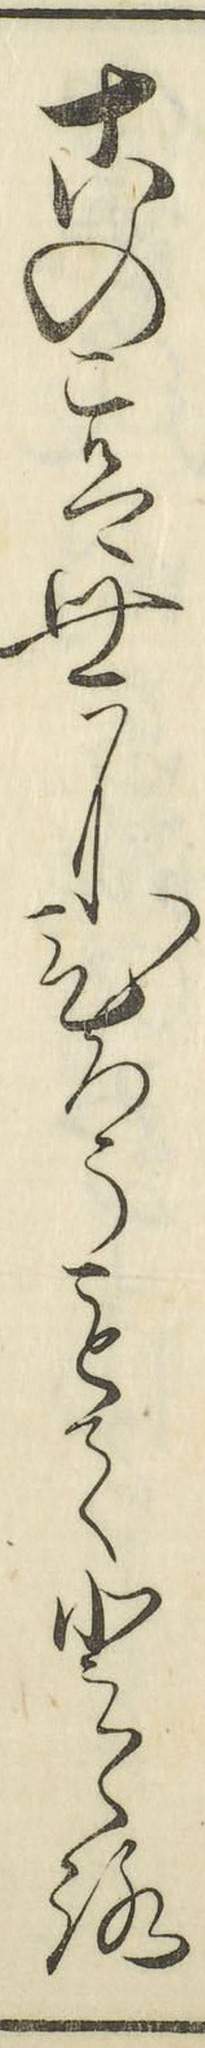このころ世にひろうもてとゝろ
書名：江戸名所図会 20巻 巻之1
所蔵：東京学芸大学教育コンテンツアーカイブ
